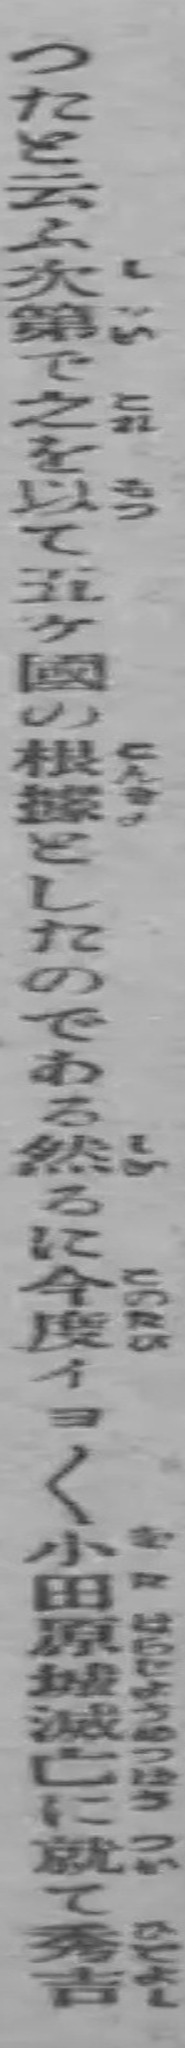つたと云ふ次第で之を以て五ケ国の根拠としたのである然るに今度イヨ〳〵小田原城滅亡に就て秀吉
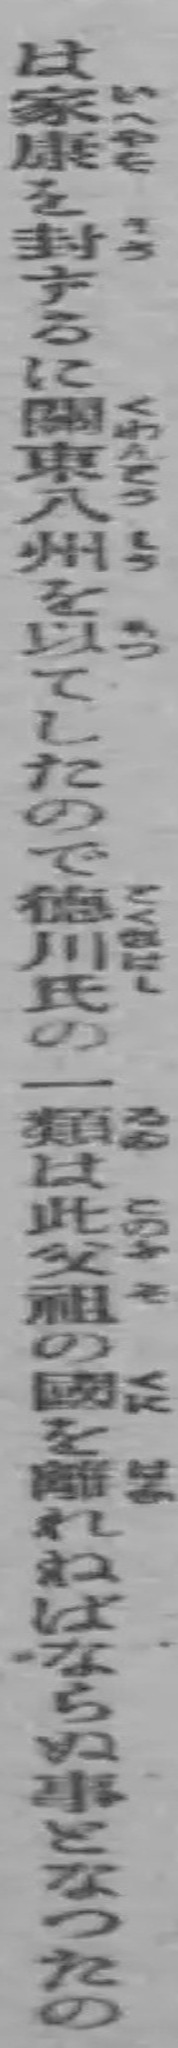は家康を封ずるに関東八州を以てしたので徳川氏の一類は此父祖の国を離れねばならぬ事となつたの
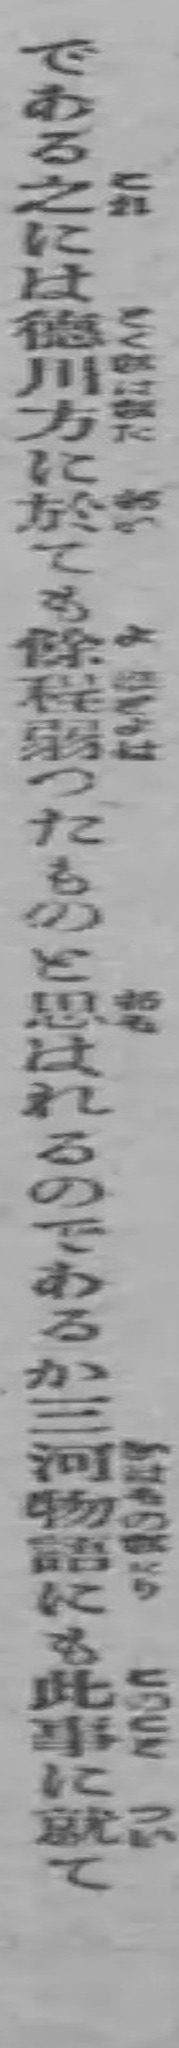である之には徳川方に於ても余程弱つたものと思はれるのであるか三河物語にも此事に就て
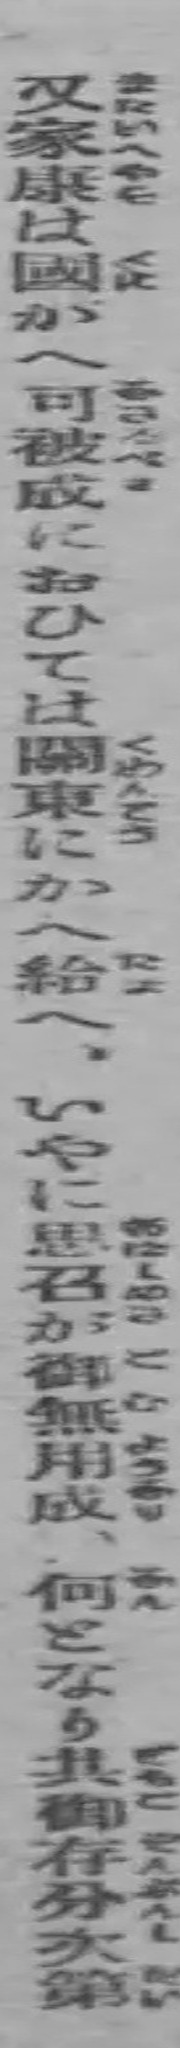又家康は国かへ可成被におひては関東にかへ給へ、いやに思召が御無用成、何となり共御存分次第
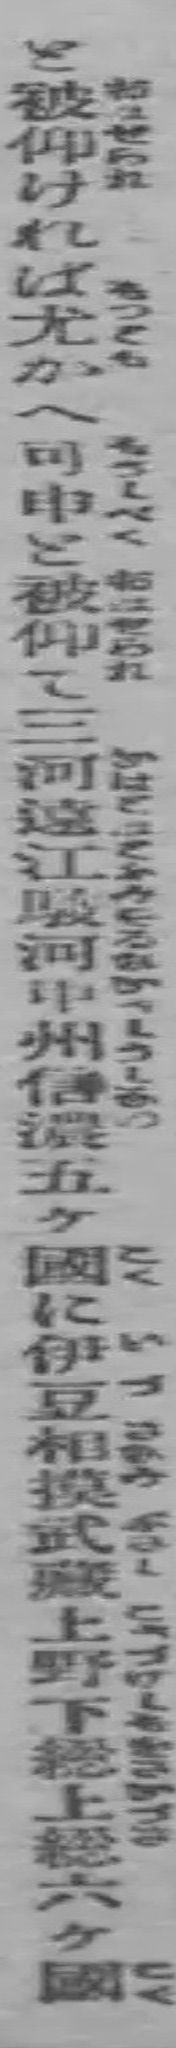と被仰ければ尤かへ可申と被仰て三河遠江駿河甲州信濃五ケ国に伊豆相模武蔵上野下総上総六ケ国
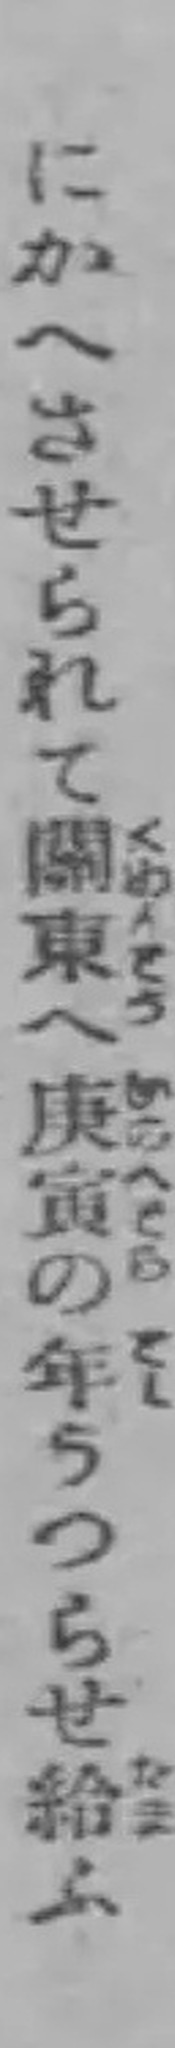にかへさせられて関東へ庚寅の年うつらせ給ふ
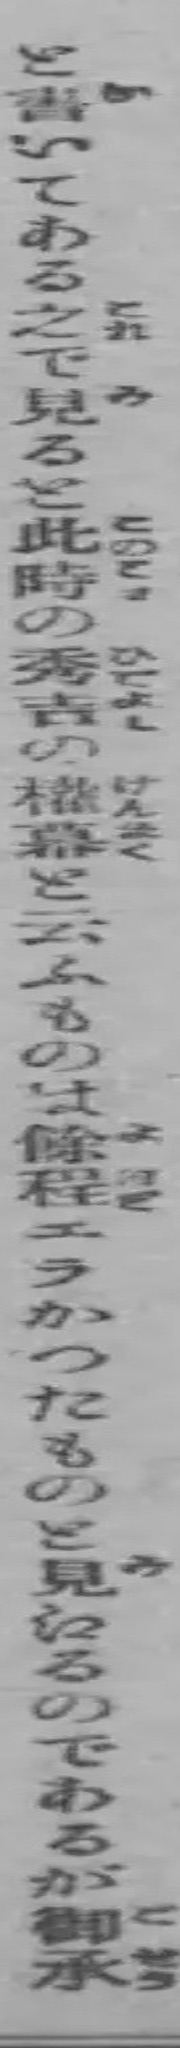と書いてある之で見ると此時の秀吉の権幕と云ふものは余程エラかつたものと見えるのであるが御承
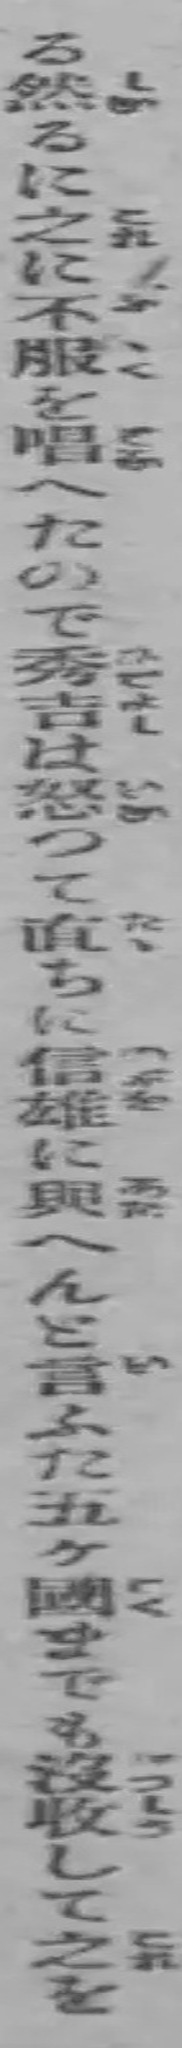る然るに之に不服を唱へたので秀吉は怒つて直ちに信雄に与へんと言ふた五ケ国までも没収して之を
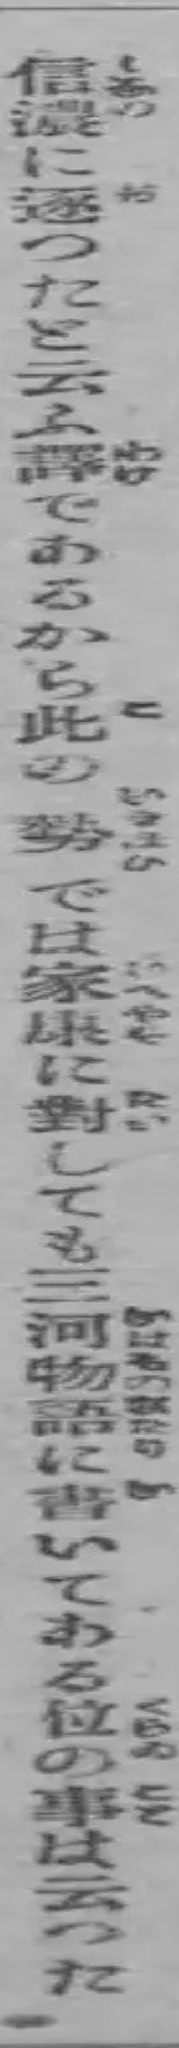信濃に逐つたと云ふ訳であるから此の勢では家康に対しても三河物語に書いてある位の事は云つた
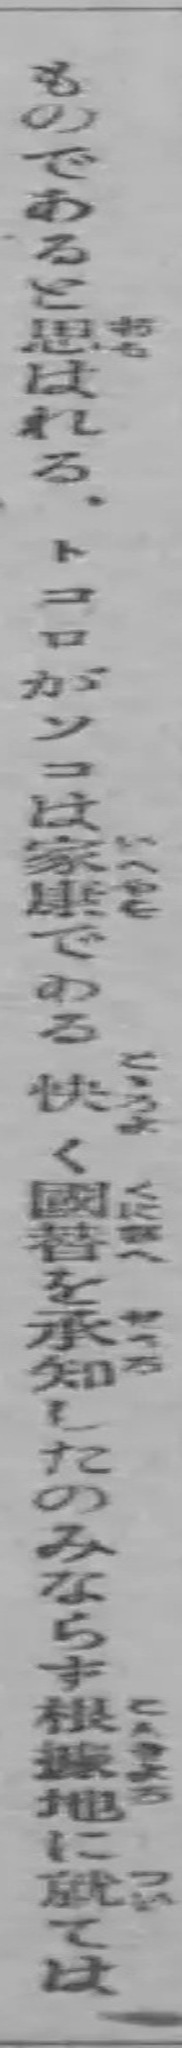ものであると思はれる、トコロがソコは家康である快く国替を承知したのみならず根拠地に就ては
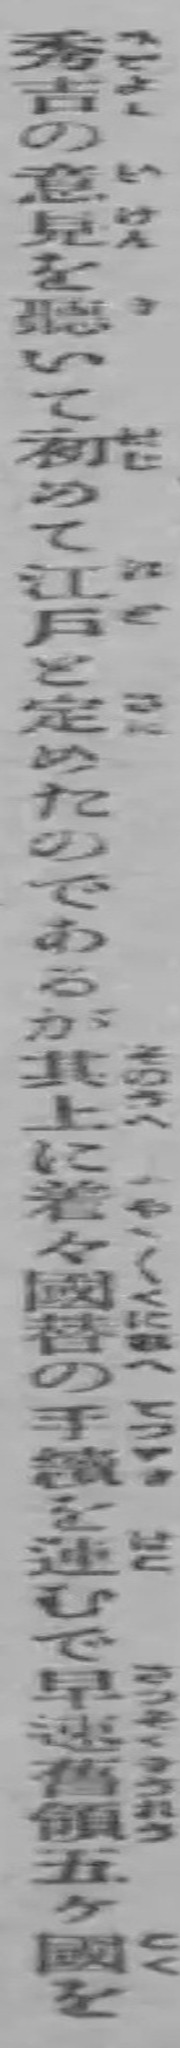秀吉の意見を聴いて初めて江戸と定めたのであるが其上に着々国替の手続を運むで早速旧領五ケ国を
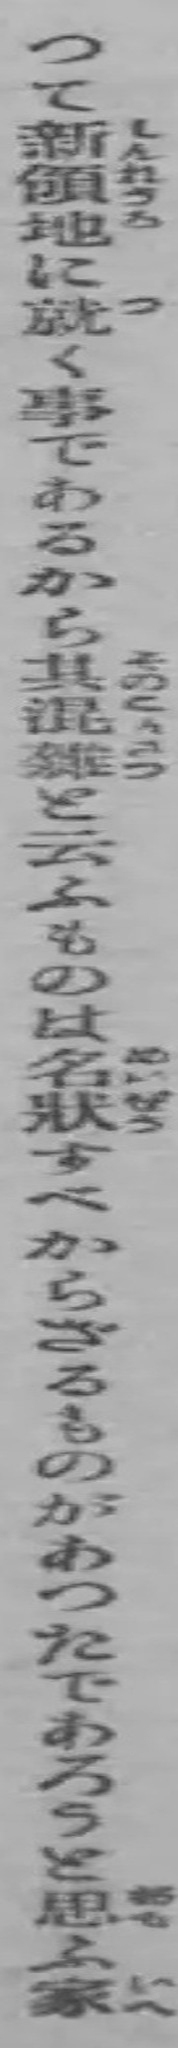つて新領地に就く事であるから其混雑と云ふものは名状すべからざるものがあつたであろうと思ふ家
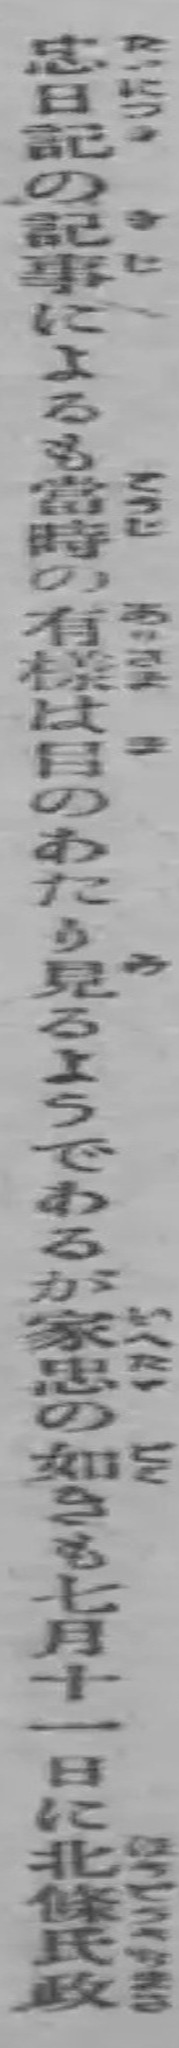忠日記の記事によるも当時の有様は目のあたり見るようであるが家忠の如きも七月十一日に北條氏政
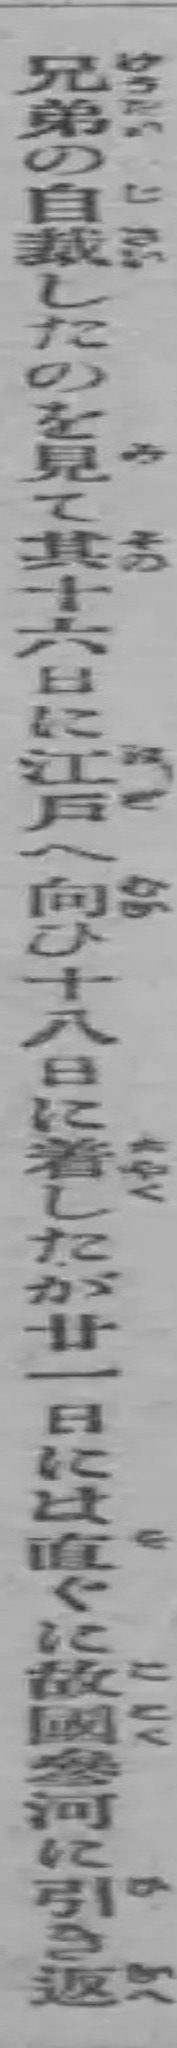兄弟の自裁したのを見て其十六日に江戸へ向ひ十八日に着したが廿一日には直ぐに故国参河に引き返
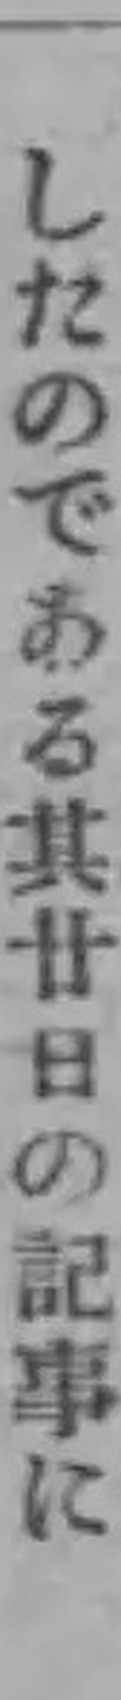したのである其廿日の記事に

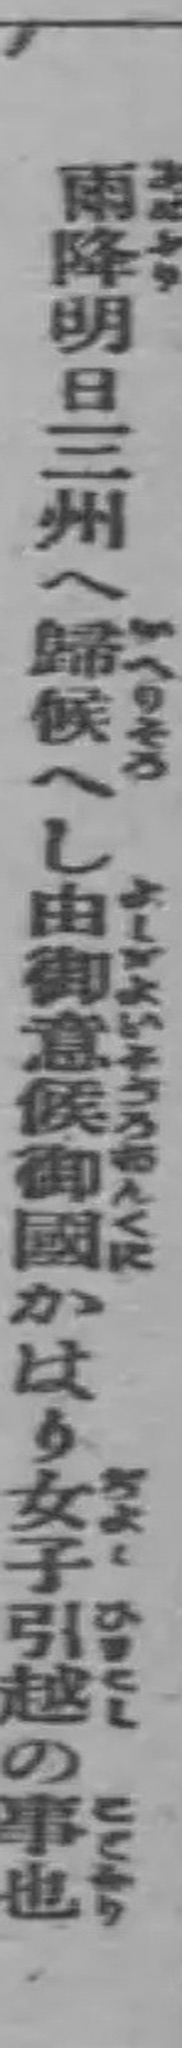雨降明日三州へ帰候へし由御意候御国かはり女子引越の事也
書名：豊橋市史談
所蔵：国立国会図書館 National Diet Library, JAPAN
